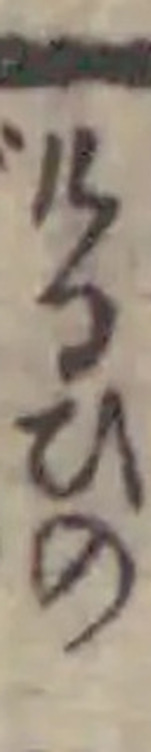けるひの
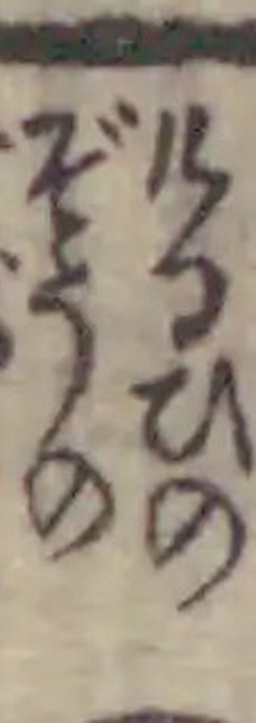ぞうの
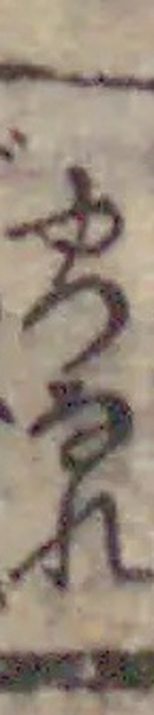やつなれ
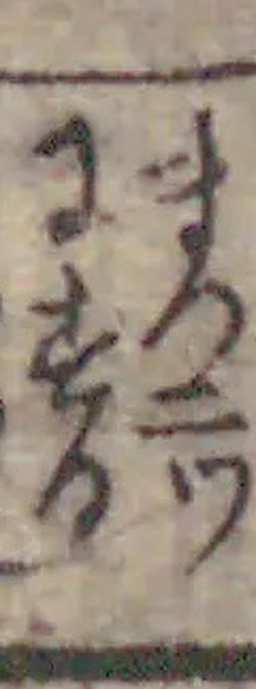にする
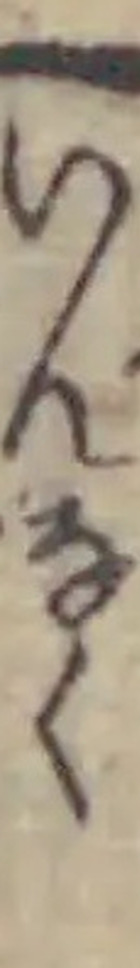いんなく
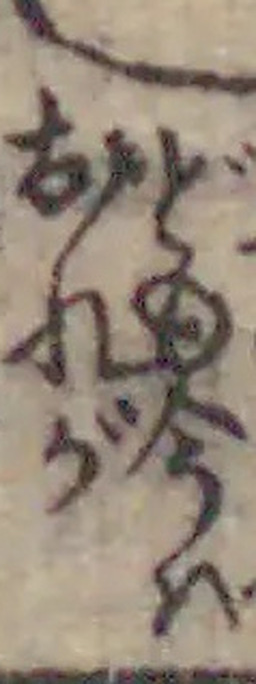おれが
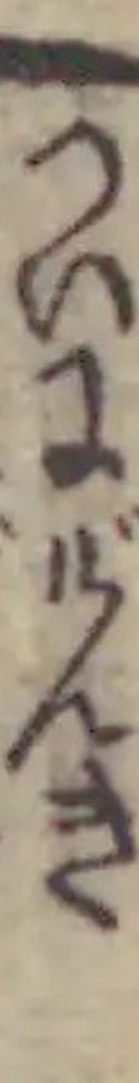ついにげんき
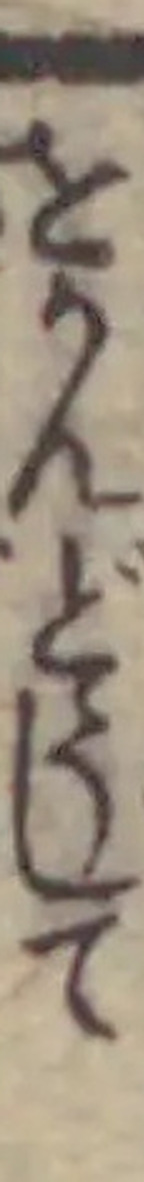をかんどうして
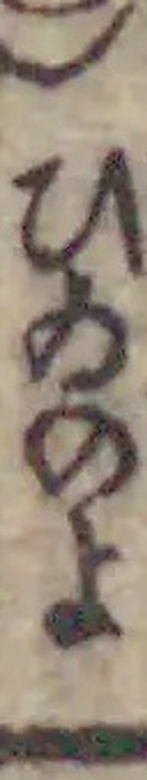ひゐのよ
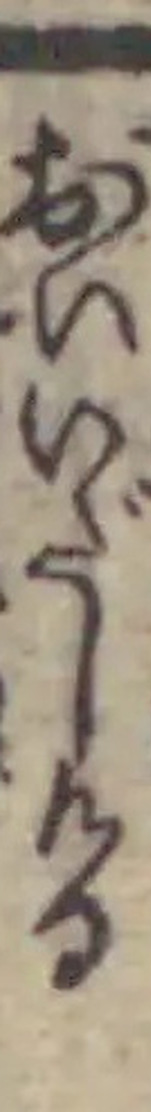おいいだしける
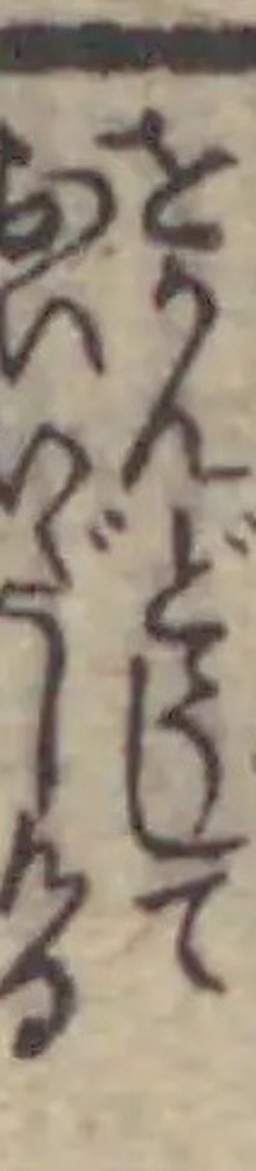おいいだしける
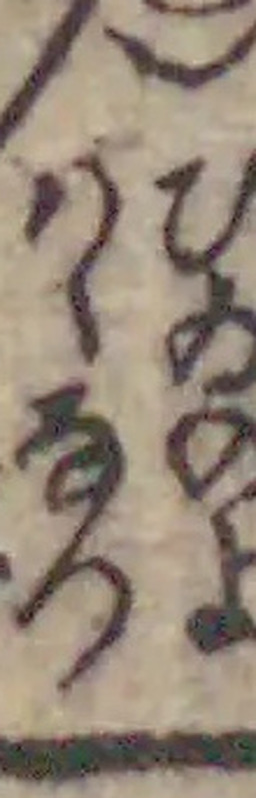はくなつ
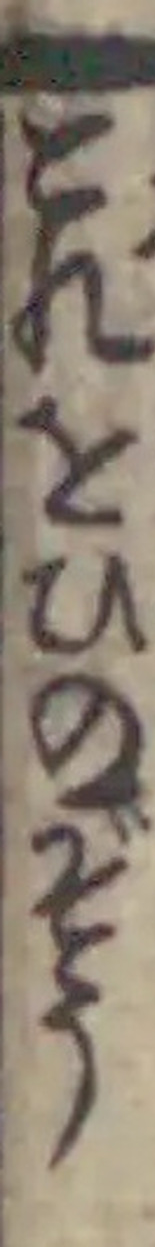これをひのぞう
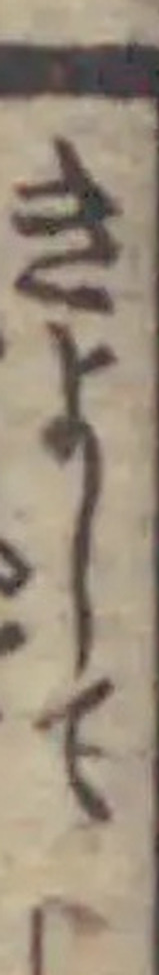きよして
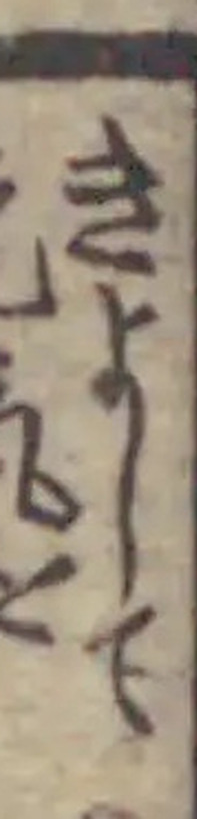きよして
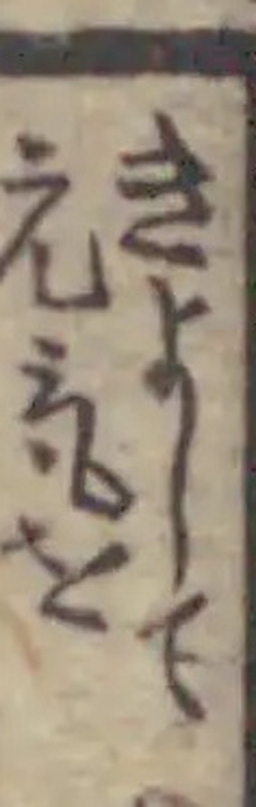元気を
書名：腹内養生主論 3巻
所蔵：国立国会図書館 National Diet Library, JAPAN
